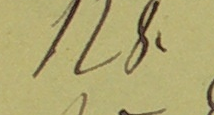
128
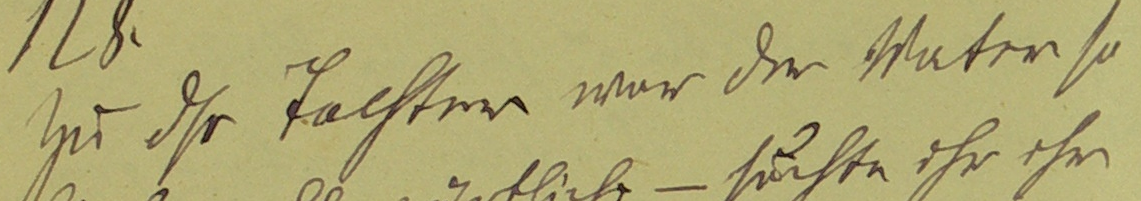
Zu disr Tochter war der Vater so
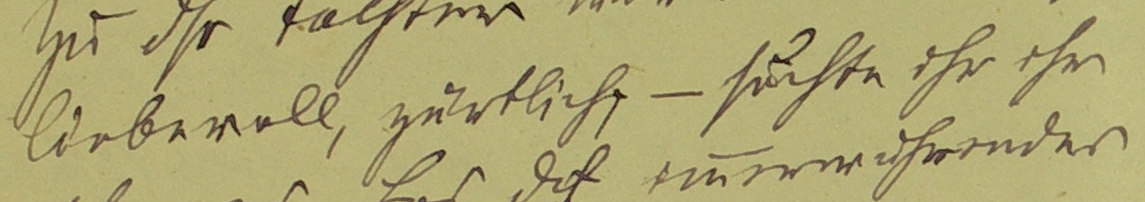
liebevoll, zärtlich, -suchte ihr ihr
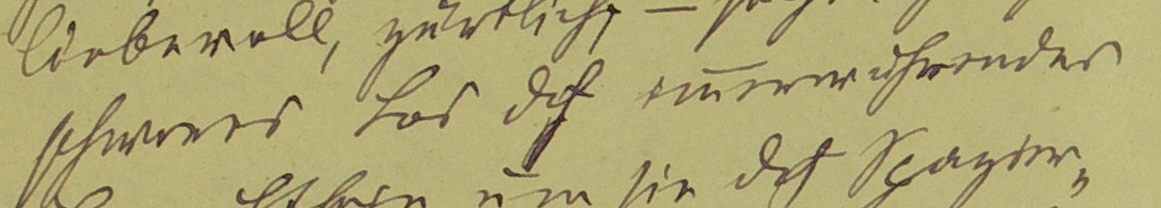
schweres Los drh imerwährendes
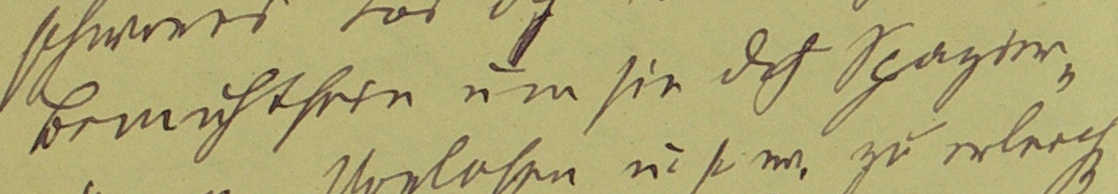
Bemüthsein um sie drh Spazier¬
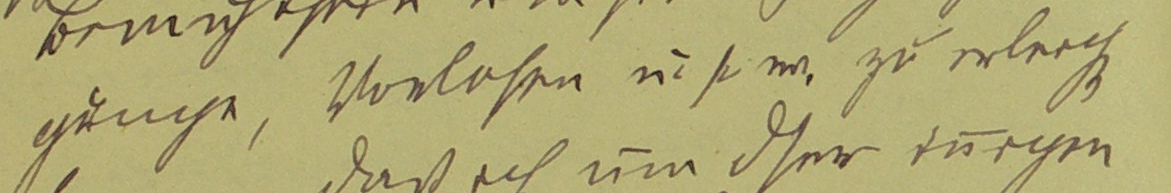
gänge, Vorlesen u.s.w. zu erleich¬
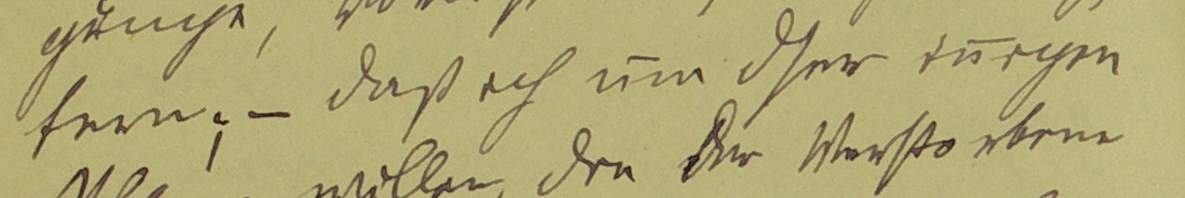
tern; - daß ich um dser inigen
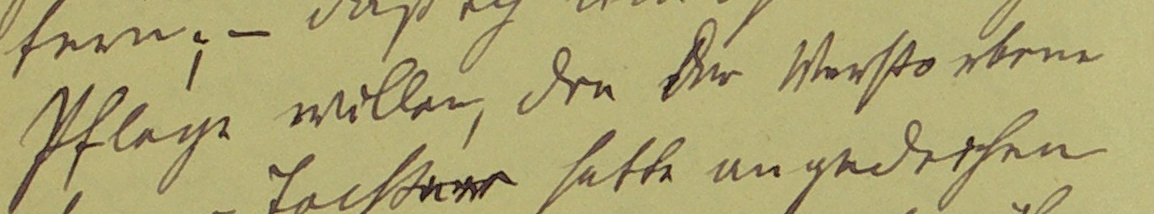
Pflege willen, die der Verstorbene
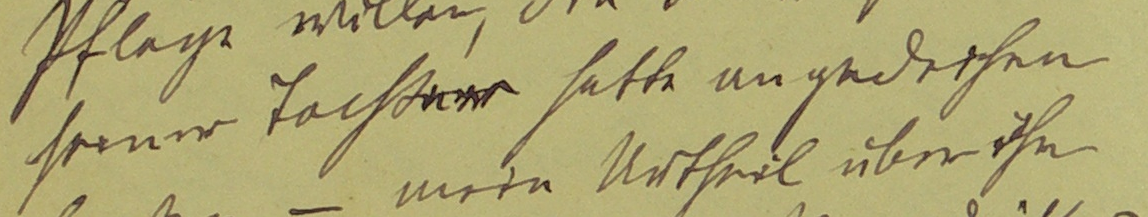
seiner Tochter hatte angedeihen
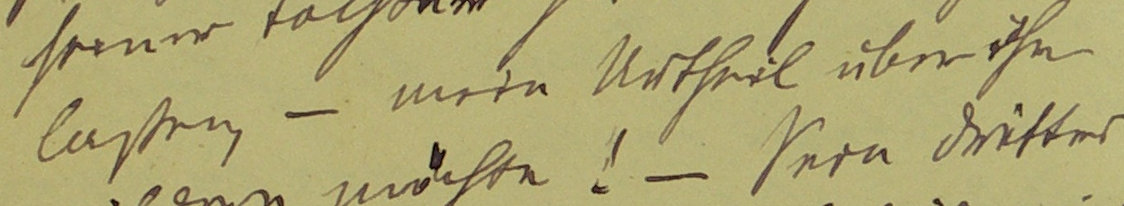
laßen, - mein Urtheil über ihn
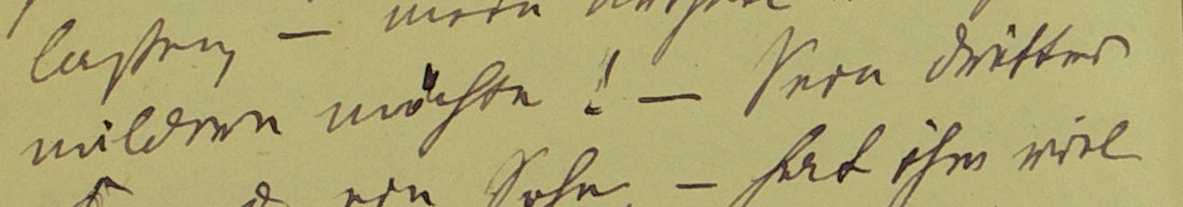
mildern möchte ! - Sein drittes
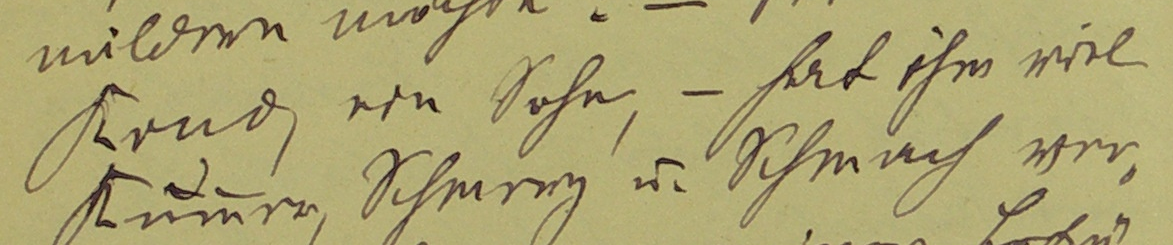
Kind, ein Sohn, - hat ihm viel
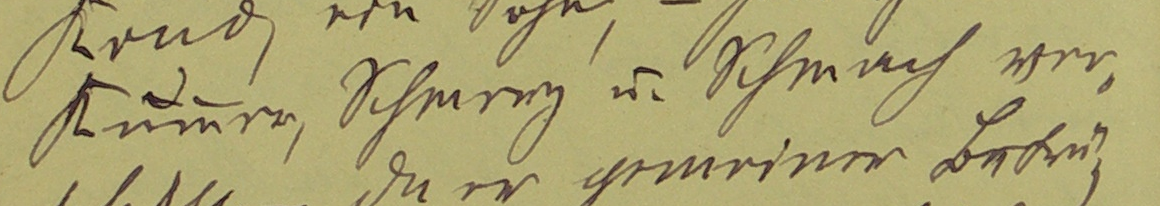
Kummer, Schmerz und Schmach ver¬
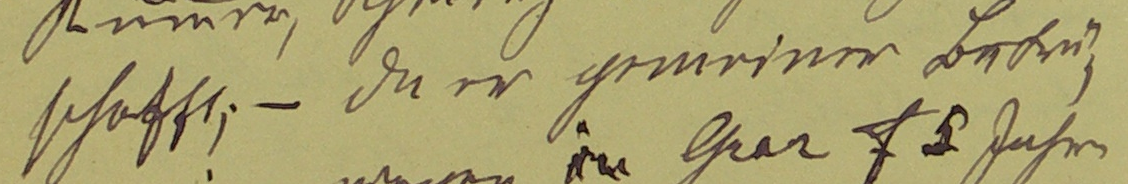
schafft; - Da er gemeinen Betrü¬
